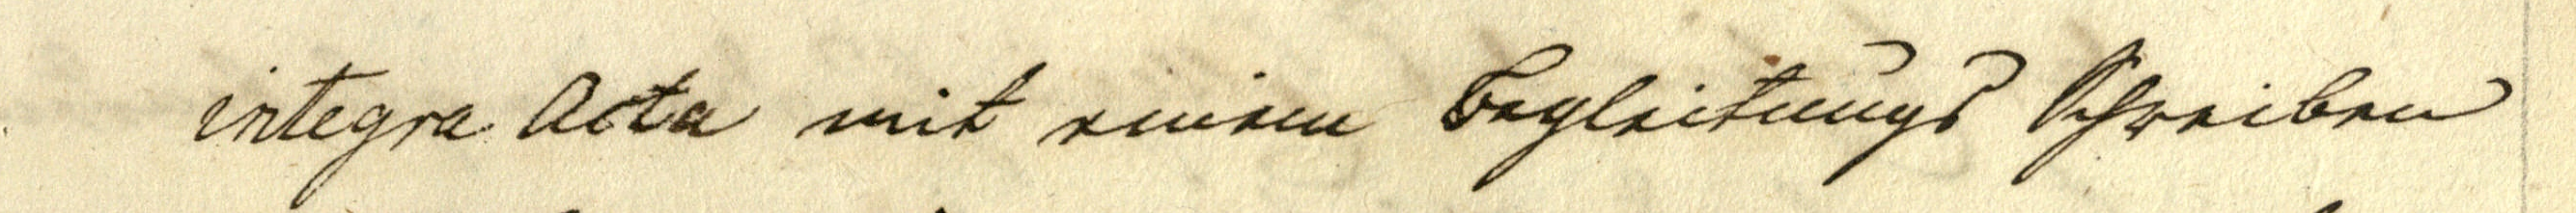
integra Acta mit einem Begleitungs Schreiben
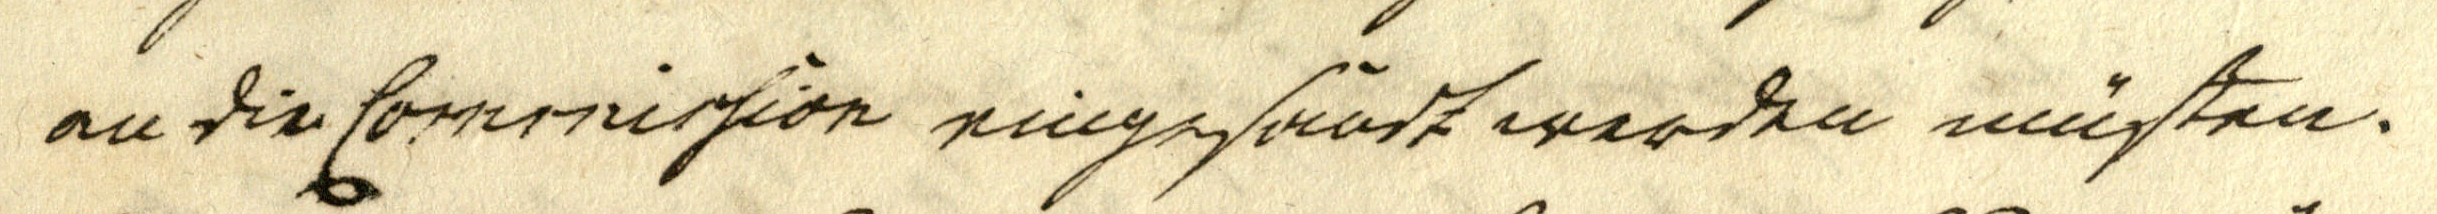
an die Commission eingesandt werden müßten
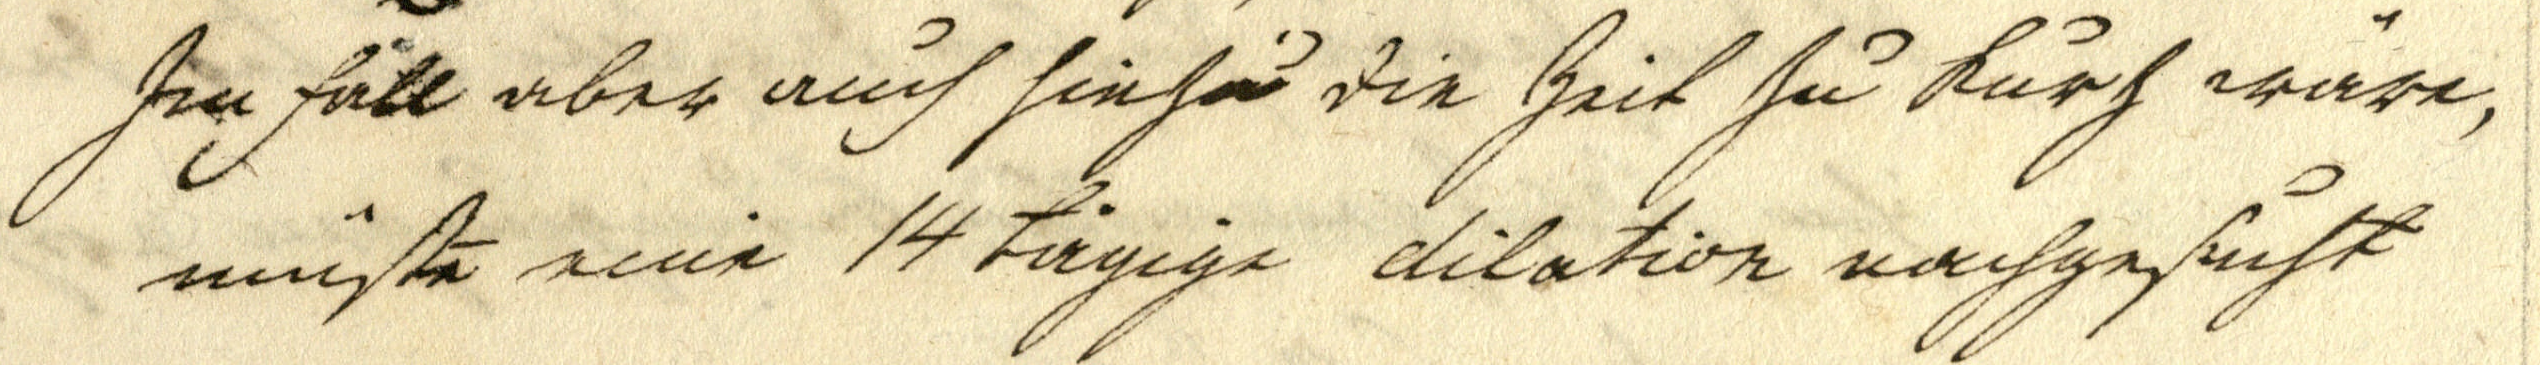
Im Fall aber auch hiezu die Zeit zu kurz wäre,
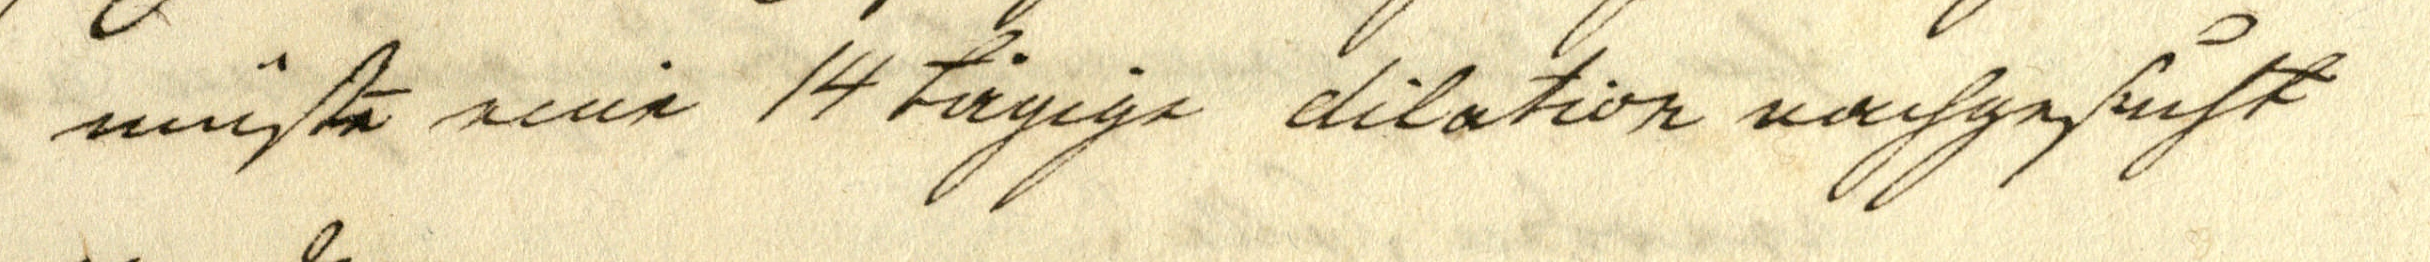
müßte eine 14 tägige dilation nachgesucht
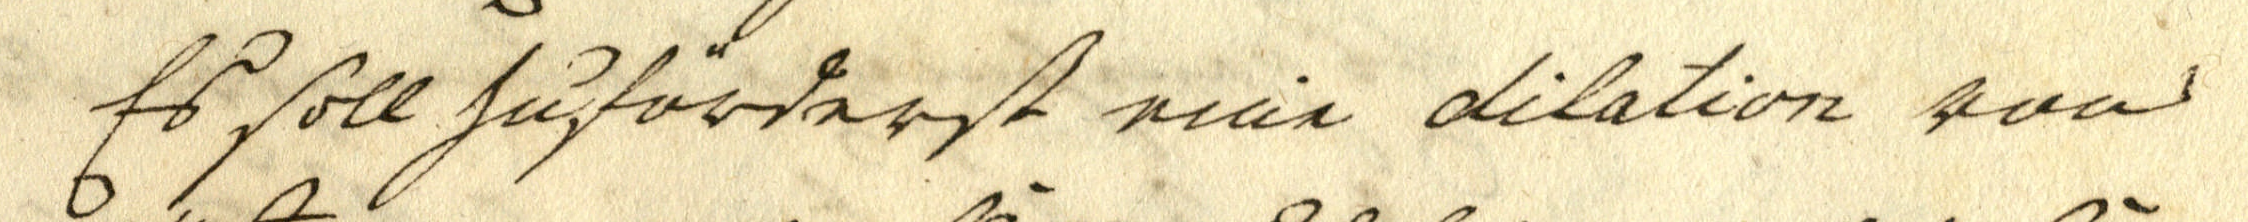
Es soll zu förderst eine dilation von
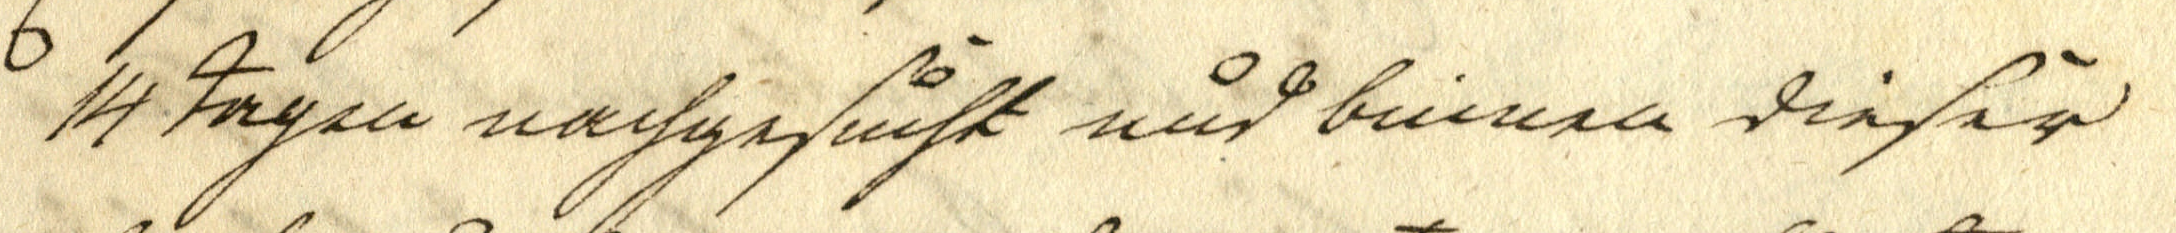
14 Tagen nachgesucht und binnen dieser
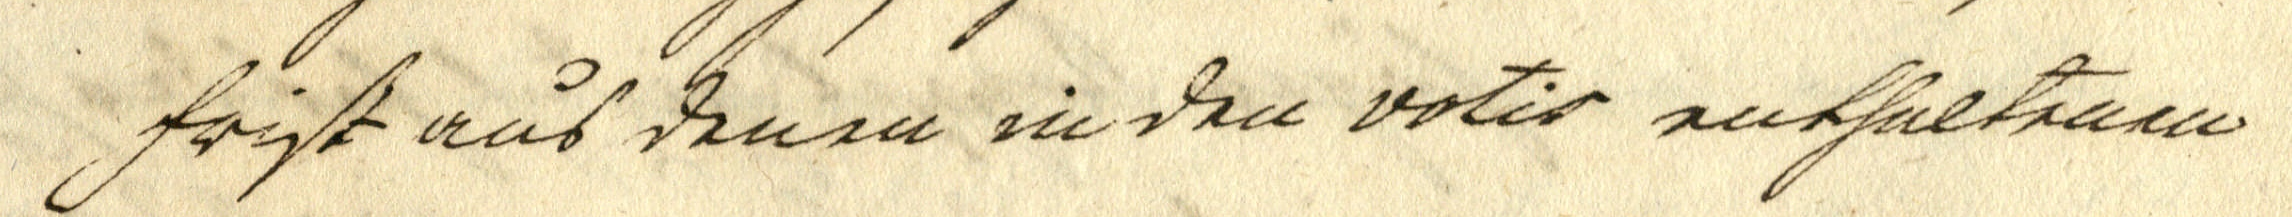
Frist aus denen in den votis enthaltenen
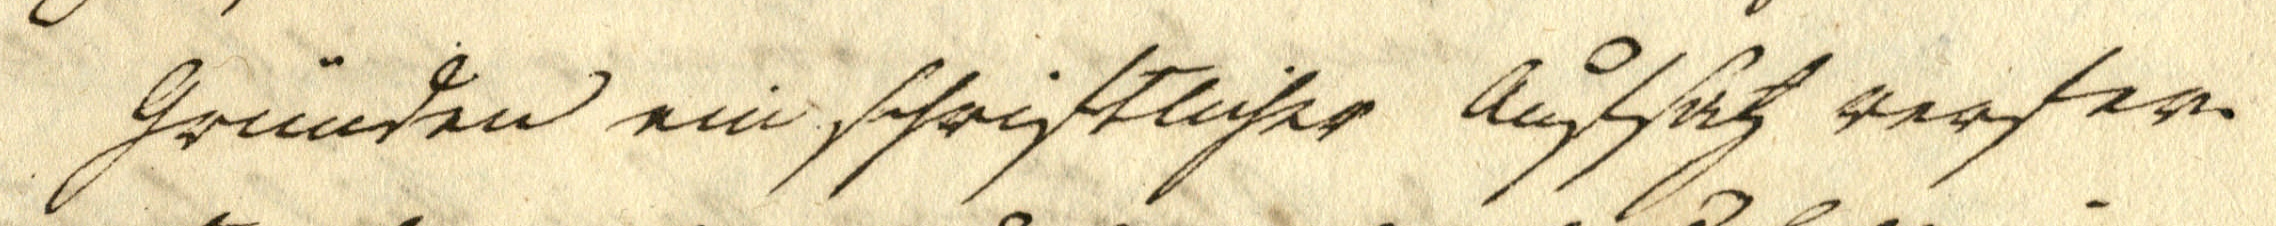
Gründen ein schriftlicher Aufsatz verfer-
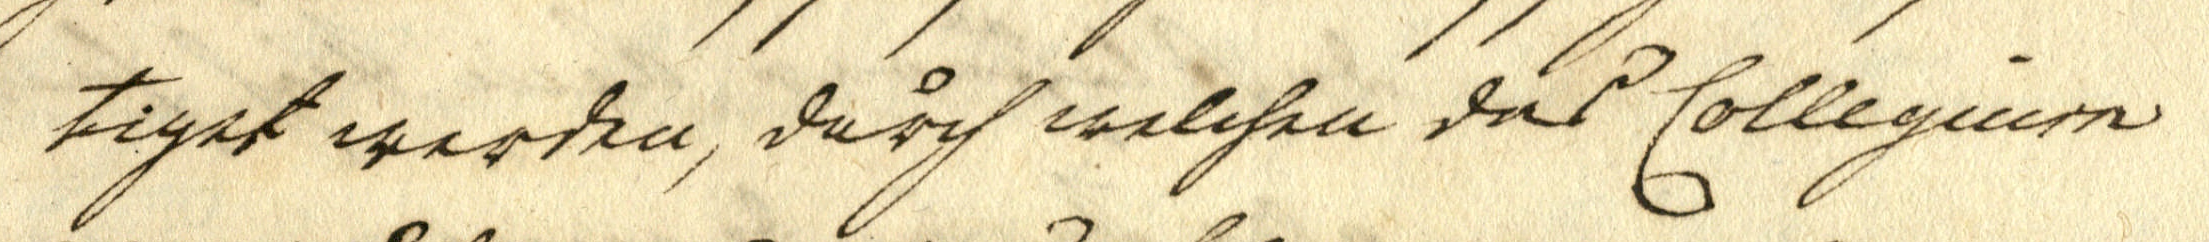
tiget werden, durch welchen das Collegium
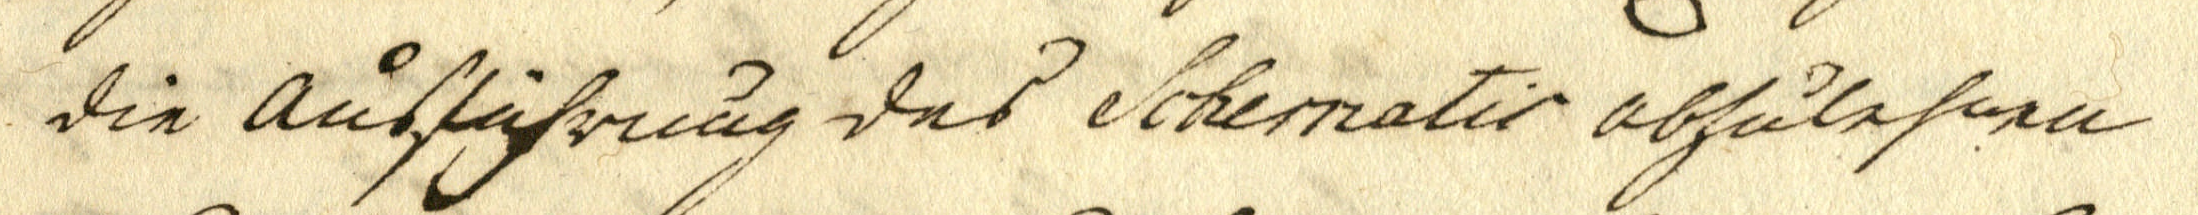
die Ausführung des Schematis abzulesen
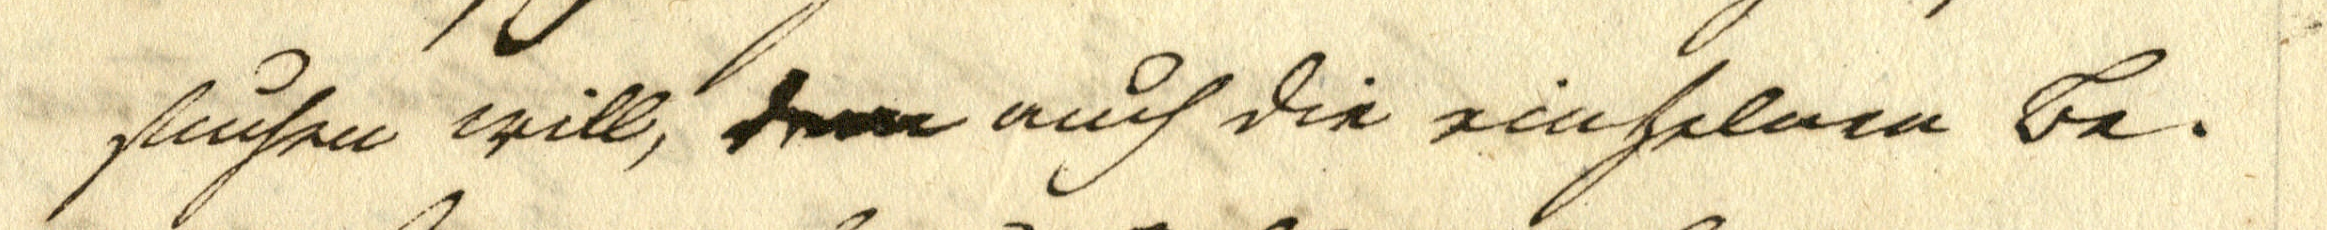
suchen will, dem auch die einzelnen Be-
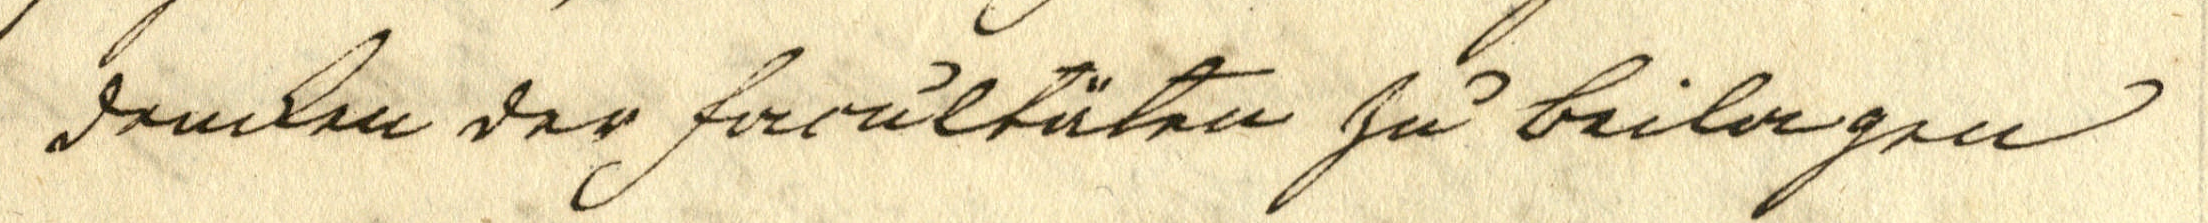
denken der Facultäten zu Beilagen
